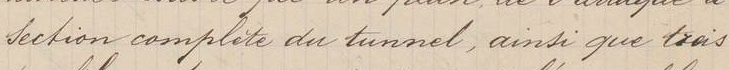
Section complète du tunnel, ainsi que trois
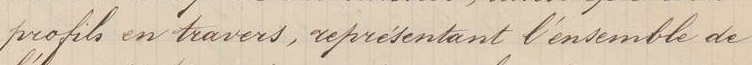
profils en travers, représentant l'ensemble de
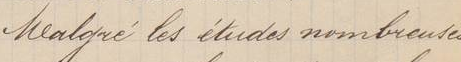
Malgré les études nombreuses
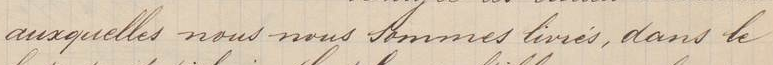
auxquelles nous nous sommes livrés, dans le
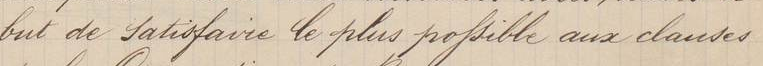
but de satisfaire le plus possible aux clauses
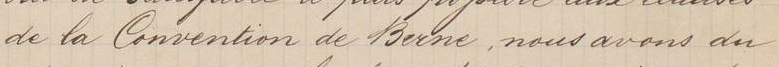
de la Convention de Berne, nous avons du
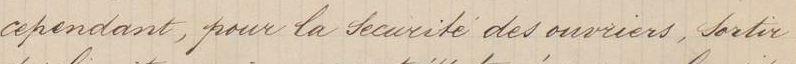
cependant, pour la securité des ouvriers, sortir
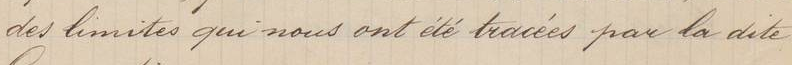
des limites qui nous ont été tracées par la dite
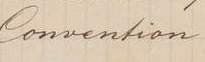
Convention.
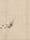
vous
